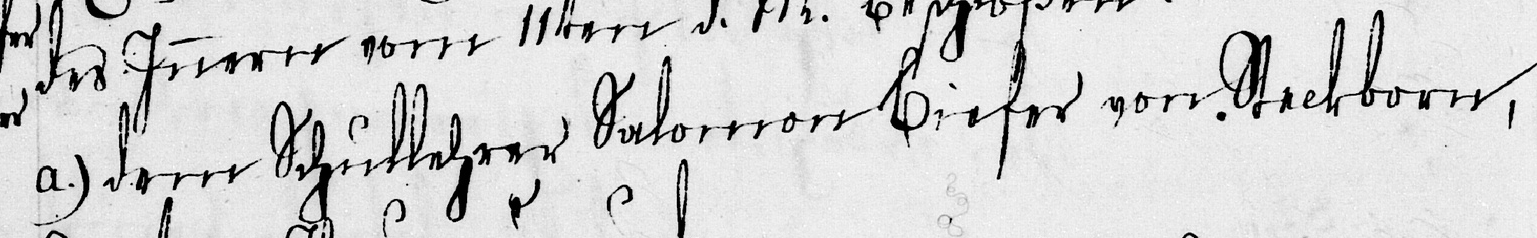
a.) dem Schullehrer Salomon Biefer von Steckborn,
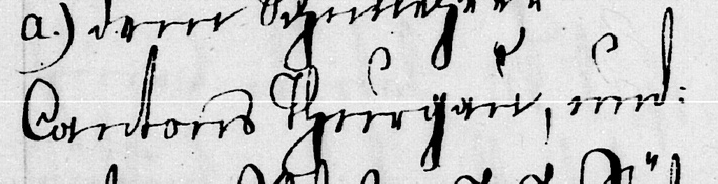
Cantons Thurgau, und:
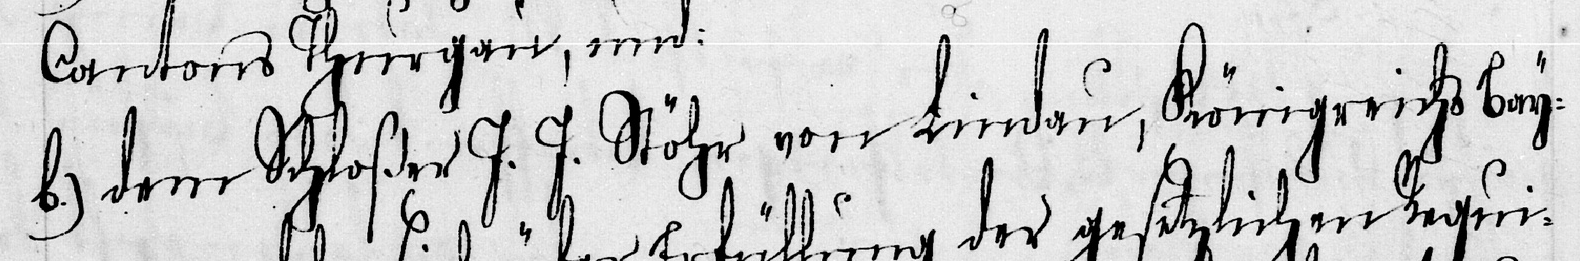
b.) dem Schloßer J. J. Stöhr von Lindau, Königreich Bay¬
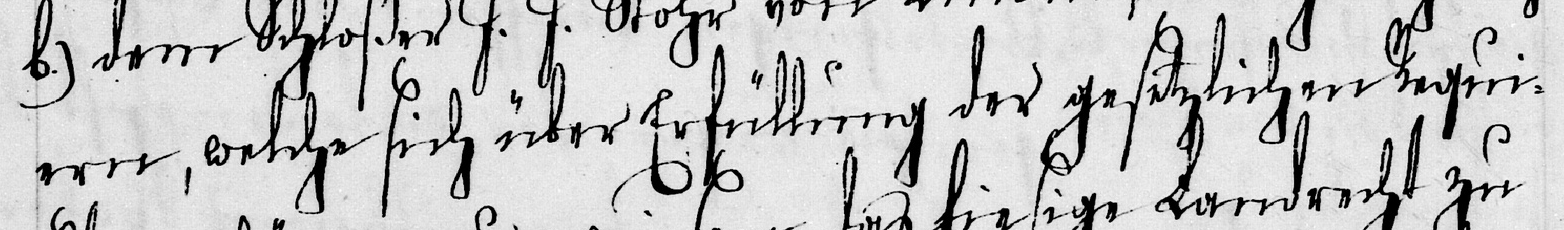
ern, welche sich über Erfüllung der gesetzlichen Inqu¬
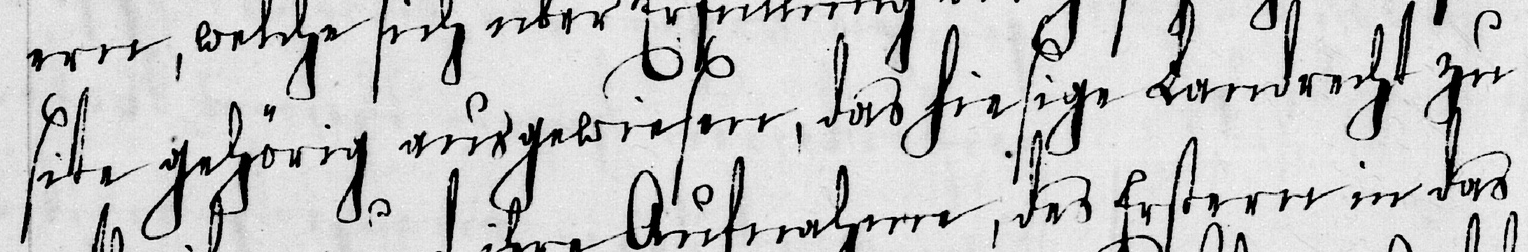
site gehörig ausgewiesen, das hiesige Landrecht zu
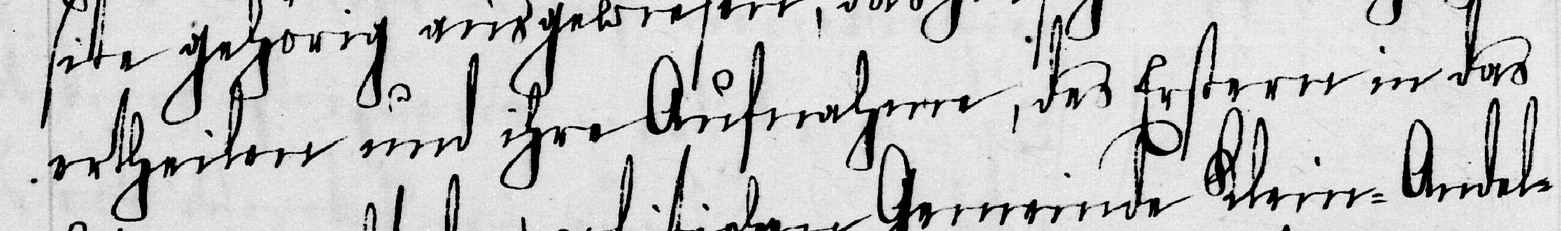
ertheilen und ihre Aufnahme, des Erstern in das
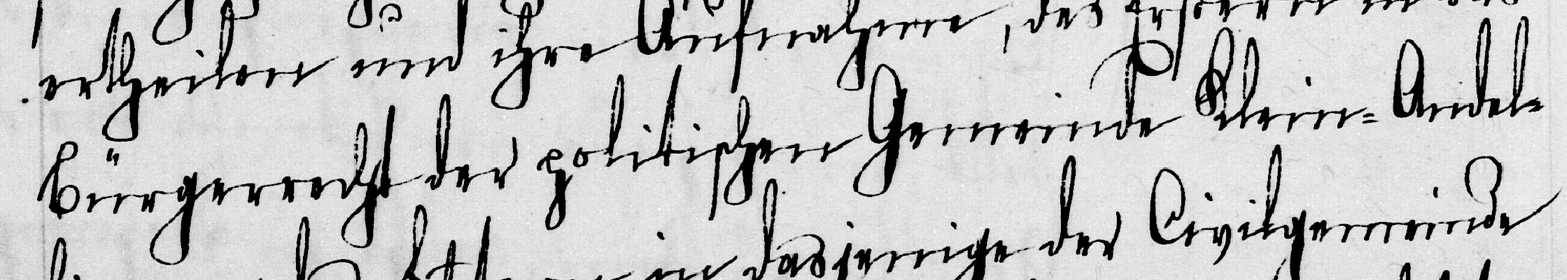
Bürgerrecht der politischen Gemeinde Klein-Andel¬
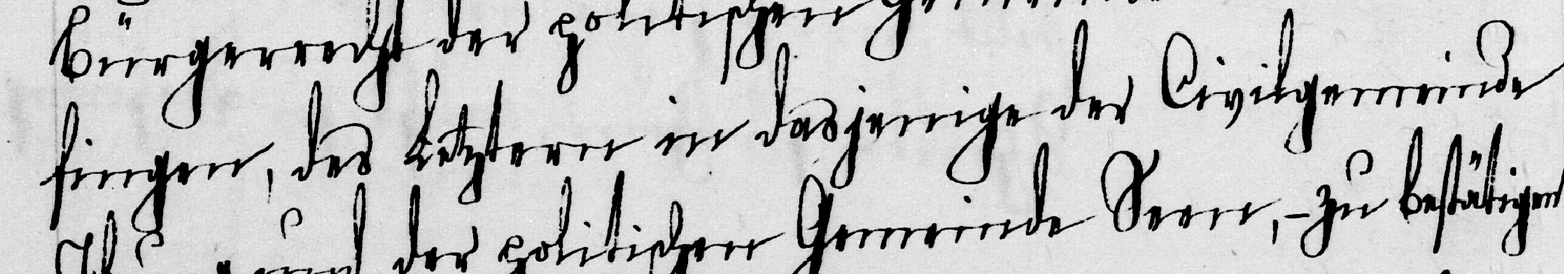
fingen, des Letztern in dasjenige der Civilgemeinde
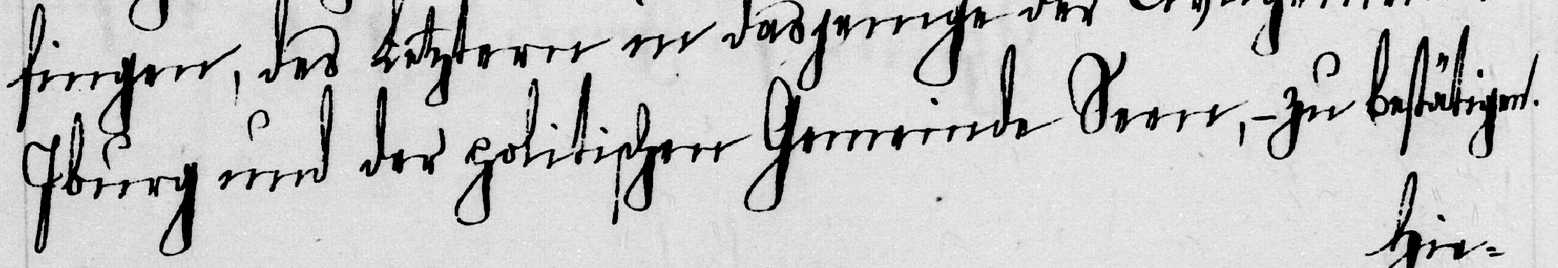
Iburg und der politischen Gemeinde Seen, – zu bestätig¬
